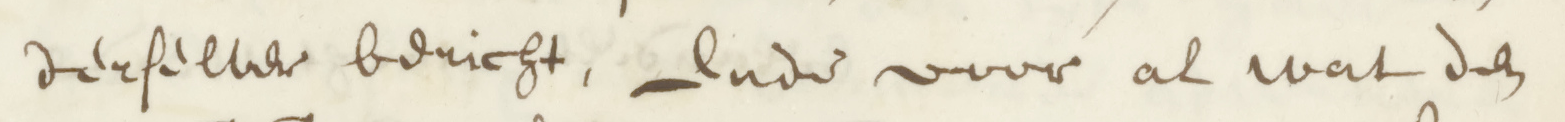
derselver bericht, ende voor al wat den
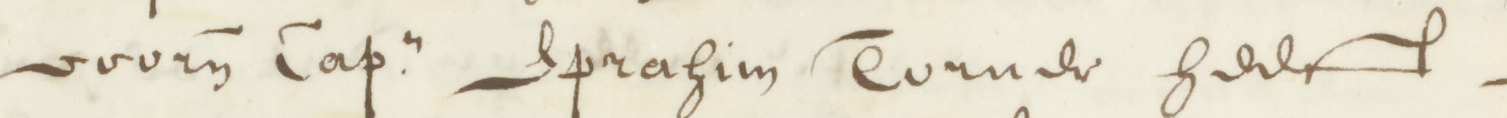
voorn Capn. Eprahim Torner heeft
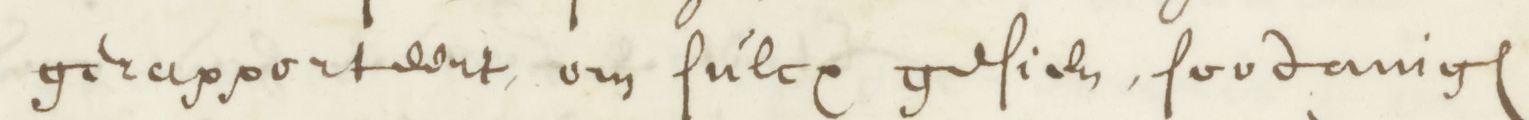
gerapporteert, om sulcx gesien, soodanigh
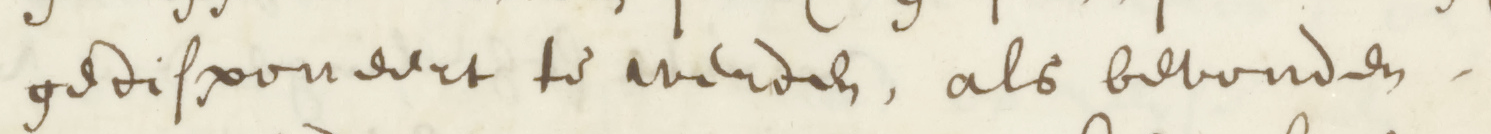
gedisponeert te werden, als bevonden
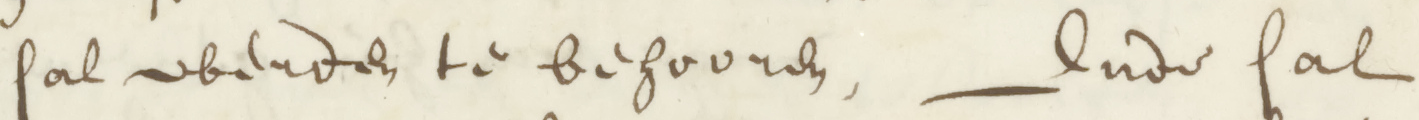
sal werden te behooren. Ende sal
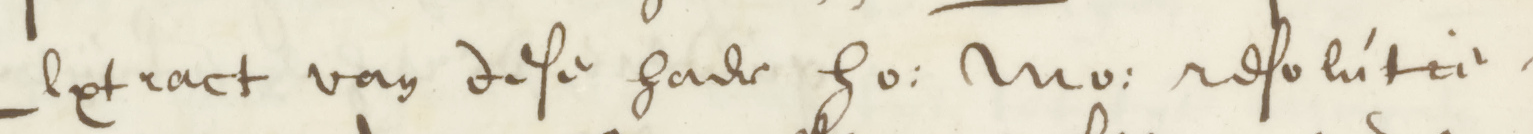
Extract van dese haer ho:Mo: resolutie
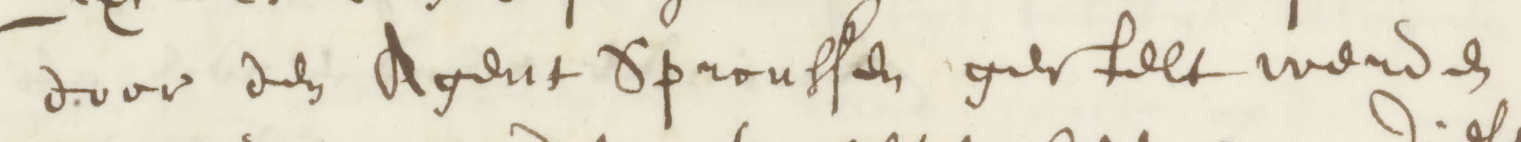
door den Agent Spronssen gestelt werden
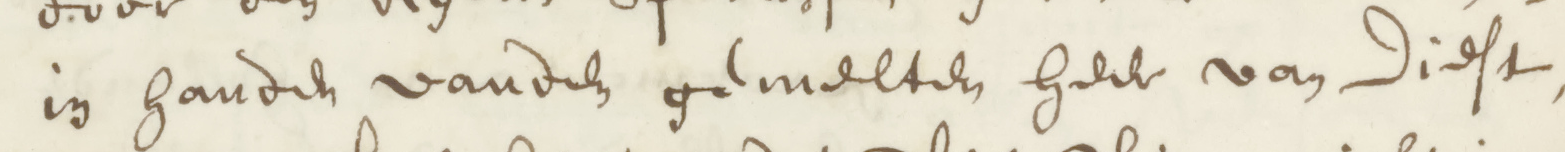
in handen vanden gemelten heer van Diest,
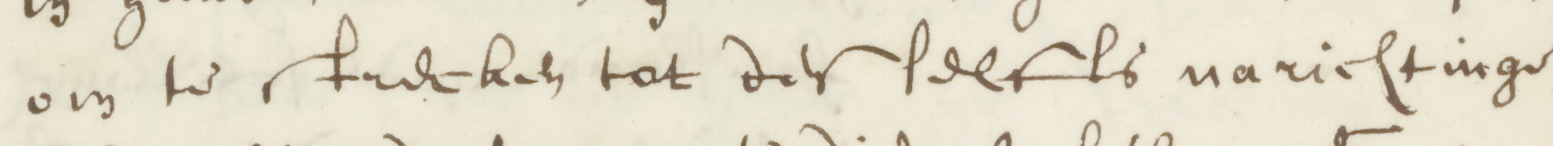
om te strecken tot desselffs narichtinge
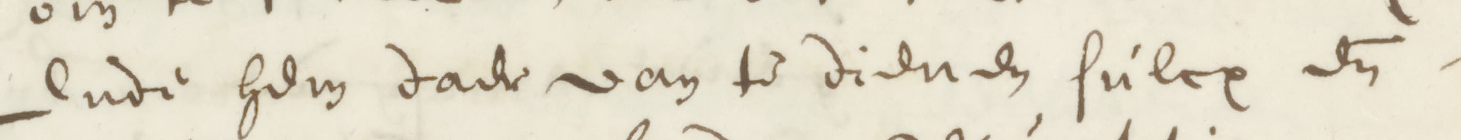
ende hem daer van te dienen sulcx en
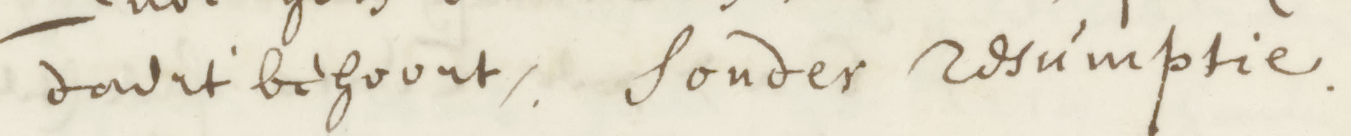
daert‛ behoort, sonder resumptie.
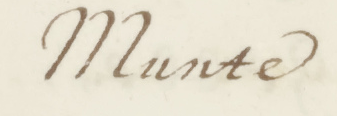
Munte
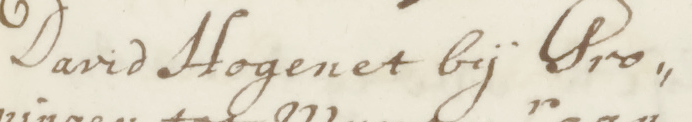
David Hogenet bij Gro„
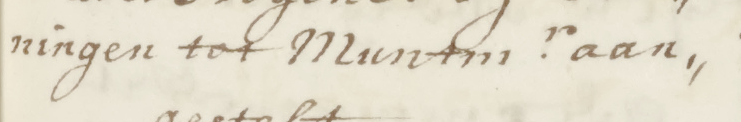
ningen tot Muntmr. aan„
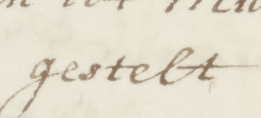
gestelt
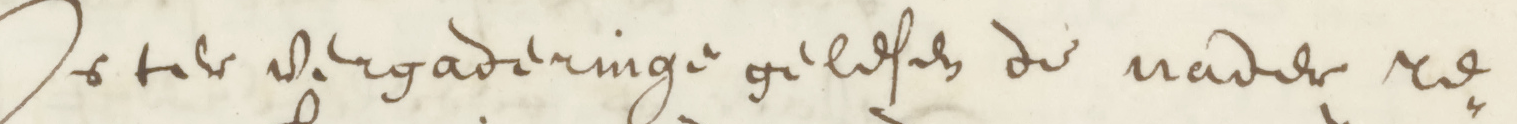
Is ter Vergaderinge gelesen de nader re„
